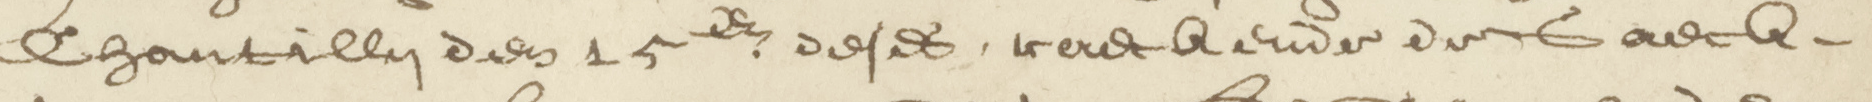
Chantilly den 15en deses, raeckende de saeck
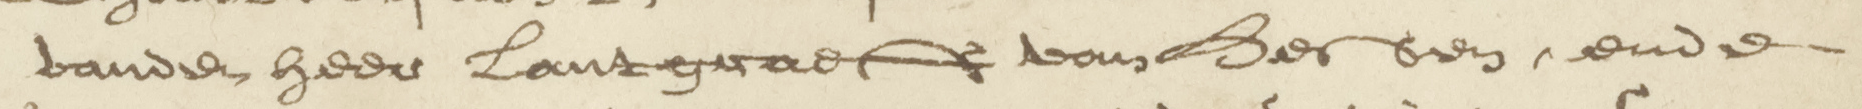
vanden heer Lantgraeff van Hessen, ende
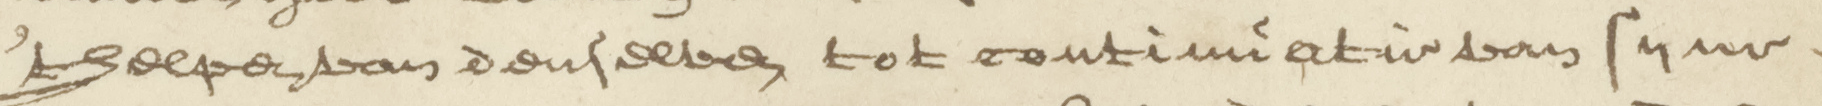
't helpen van denselven tot continuatie van syne
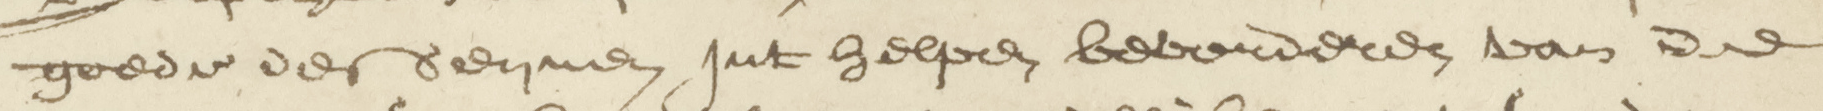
goede desseynen int helpen bevorderen van de
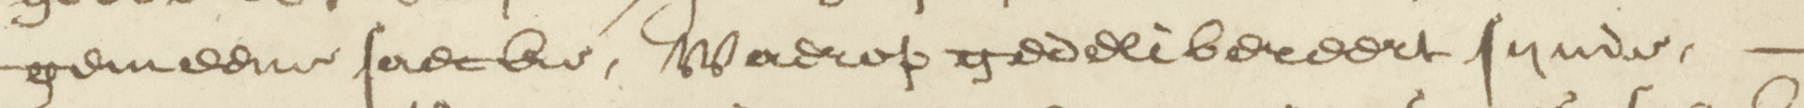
gemeene saecke, waerop gedelibereert synde,
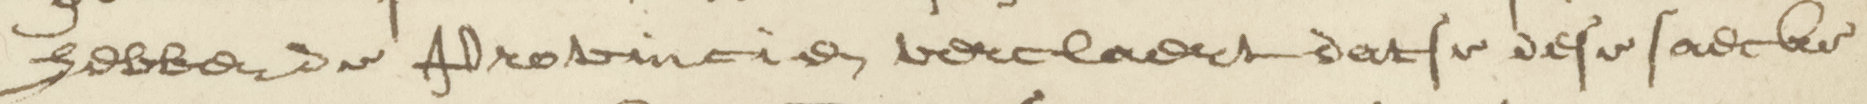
hebben de provincien verclaert datse dese saecke
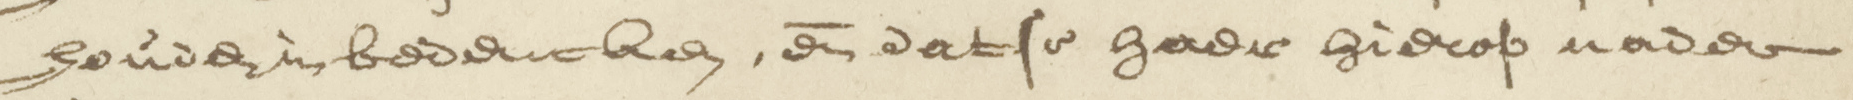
zouden bedencken en datse haer hierop nader
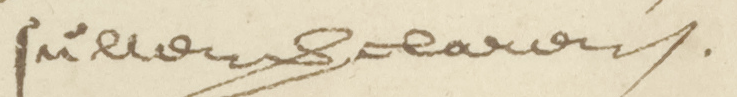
sullen verclaren.
